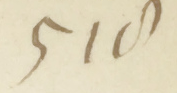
518
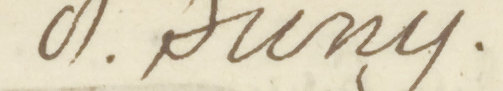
8. Junij.
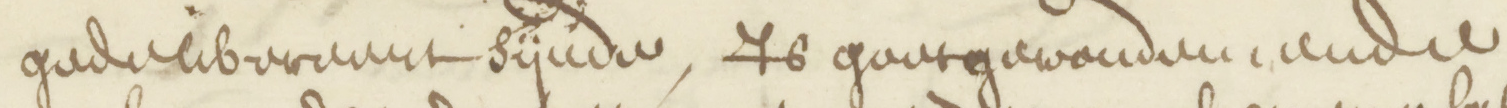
gedelibereert sijnde, Is goetgevonden, ende
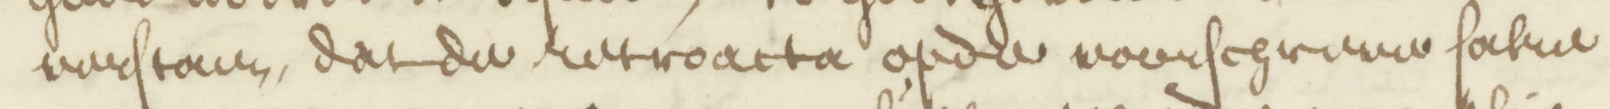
verstaen, dat de retroacta opde voorschreve sake
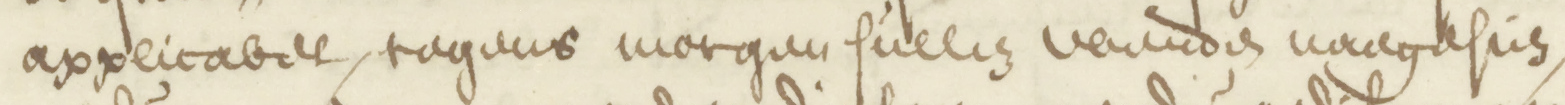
applicabel, tegens morgen sullen werden naegesien,
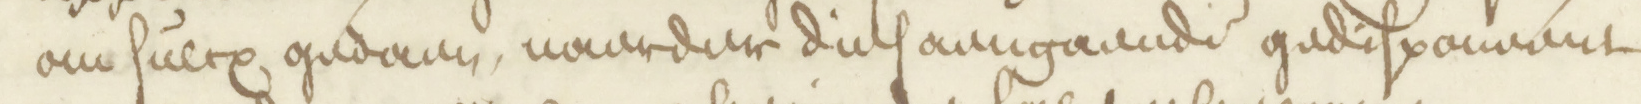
om sulcx gedaen, naerder diesaengaende gedisponeert
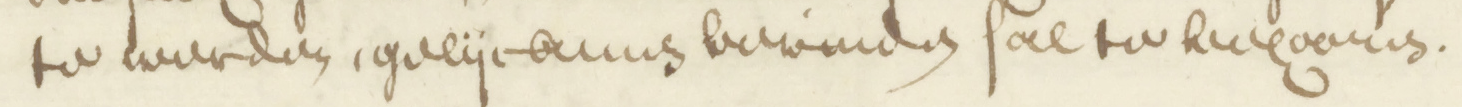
te werden, gelijck men bevinden sal te behooren.
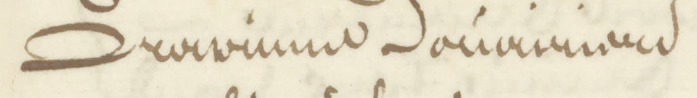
Gravinne Douairiere
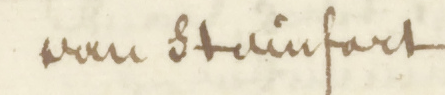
van Steinfort
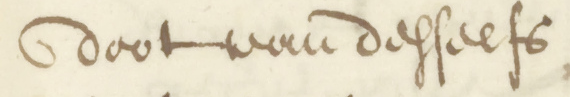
doot van desselfs
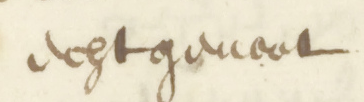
echtgenoot
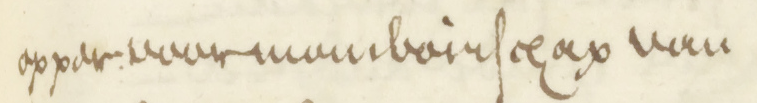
opper voormomboirschap van
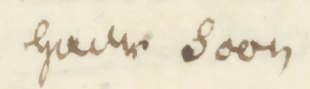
haer Soon
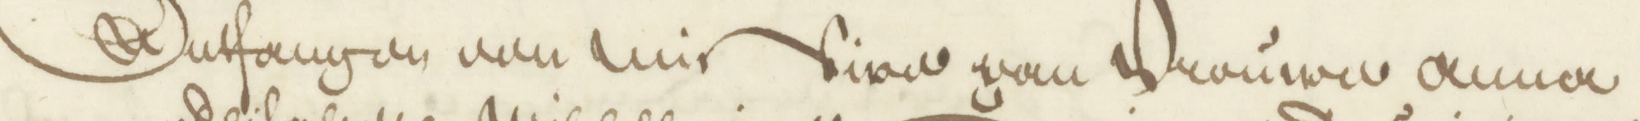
Ontfangen een Missive van Vrouwe Anna
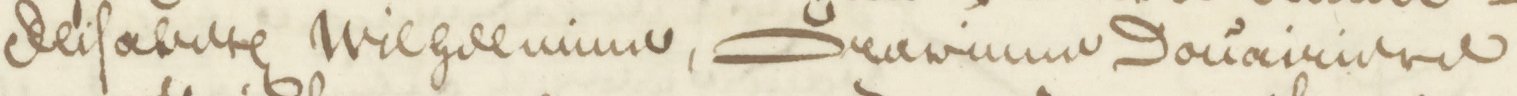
Elisabeth Wilhelmine, Gravinne Douairiere
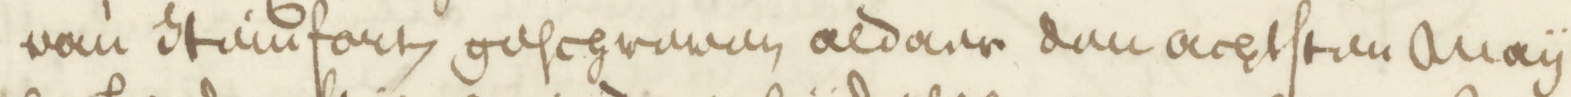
van Steinfort, geschreven aldaer den achtsten Maij
